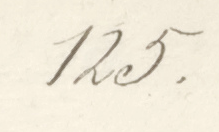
125.
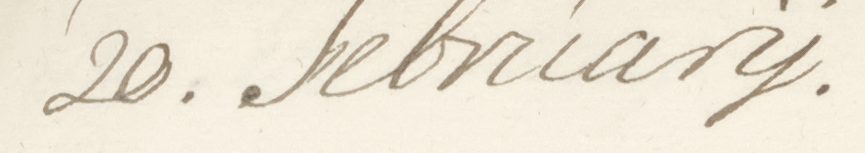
20. Februarij.
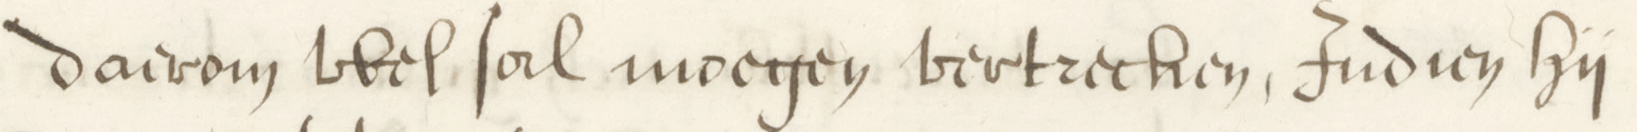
daerom wel sal moegen vertrecken, Indien hij
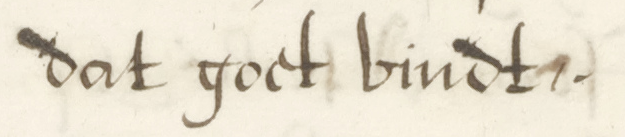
dat goet vindt.
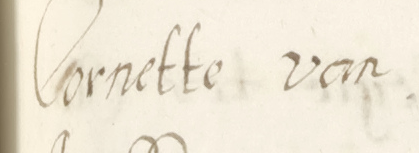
Cornette van
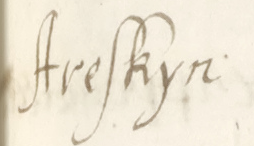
Areskyn
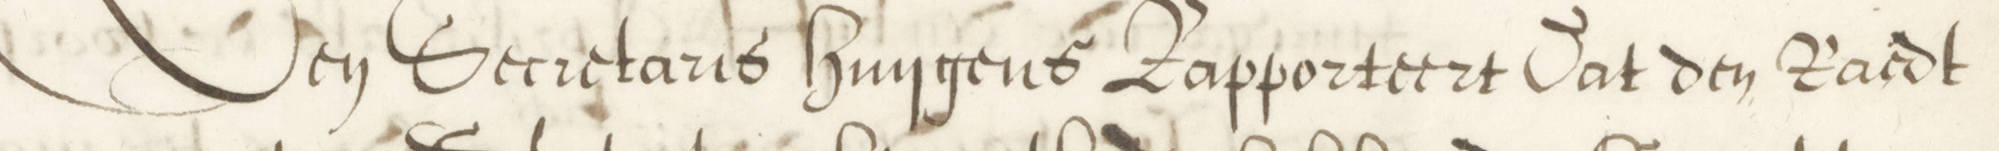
Den Secretaris Huygens Rapporteert dat den Raedt
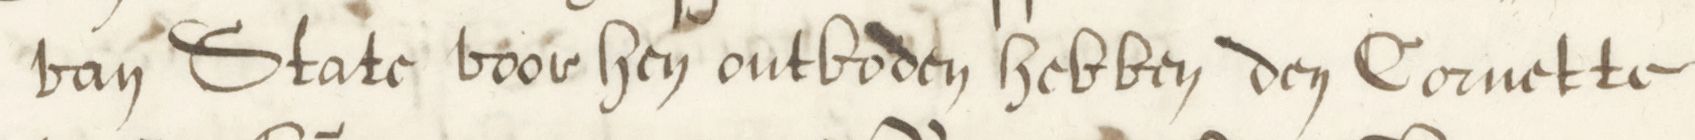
van State voor hen ontboden hebben den Cornette
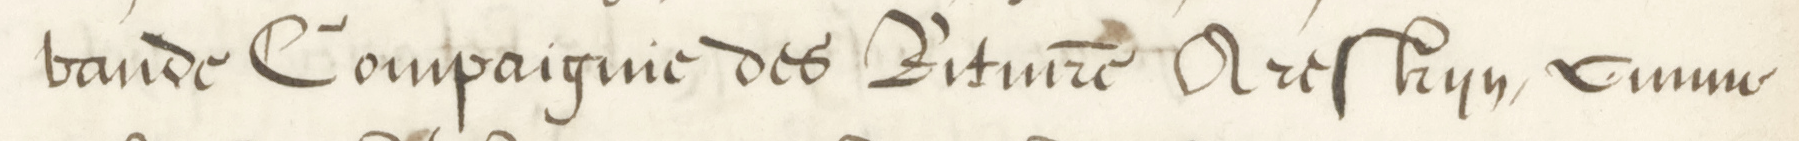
vande Compaignie des Ritmre Areskyn, omme
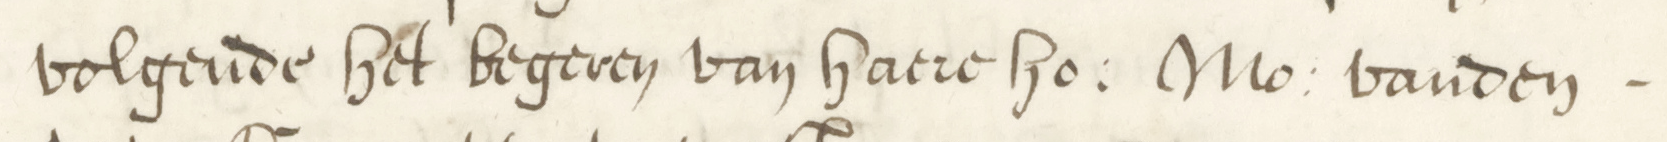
volgende het begeren van haere ho:Mo: vanden
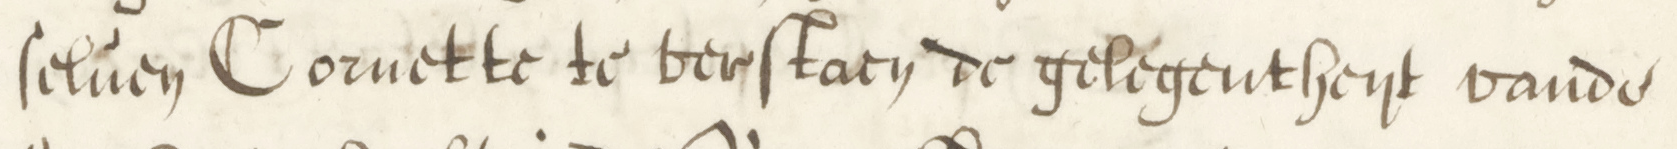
seluen Cornette te verstaen de gelegentheyt vande
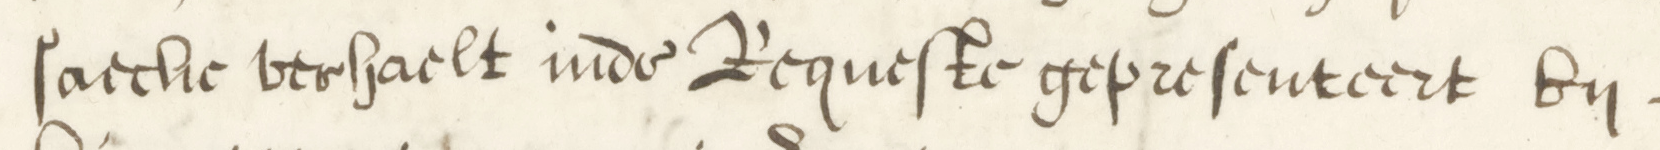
saecke verhaelt inde Requeste gepresenteert by
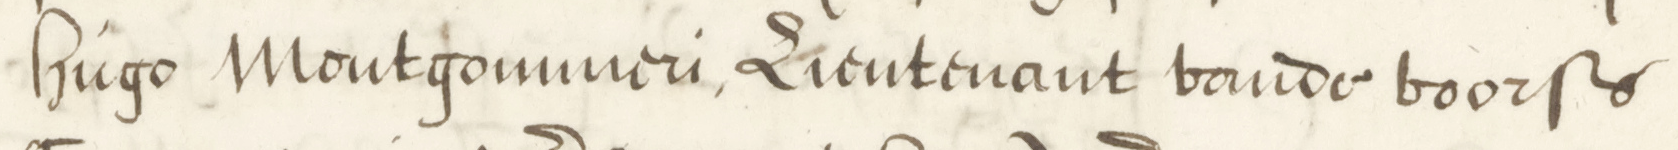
Hugo Montgommeri, Lieutenant vande voors
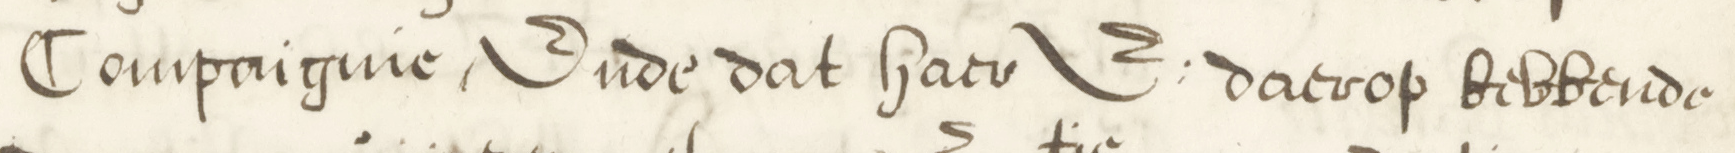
Compaignie. Ende dat haer E: daerop bewende
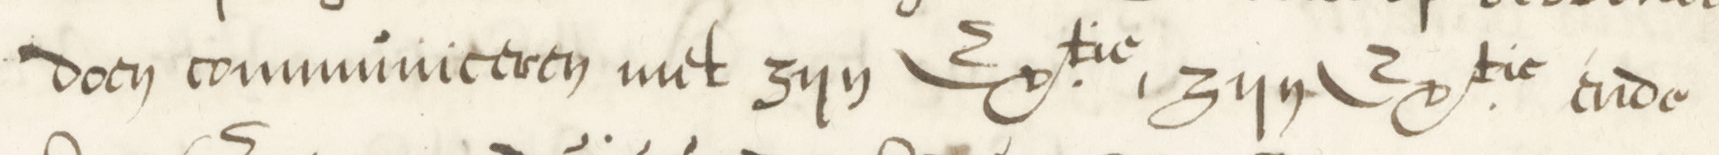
doen communiceren met zyn Extie., zyn Extie. ende
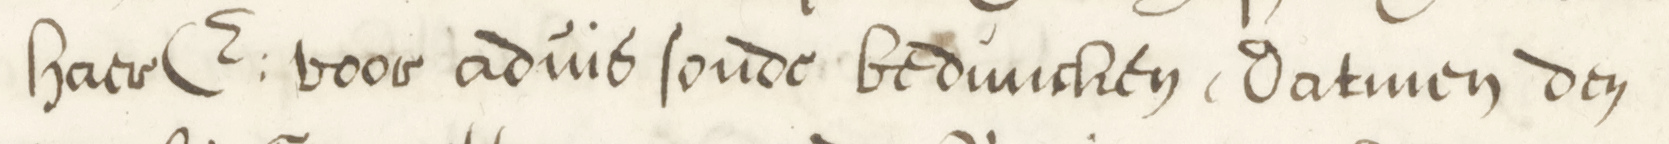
haer E: voor aduis soude beduncken, datmen den
